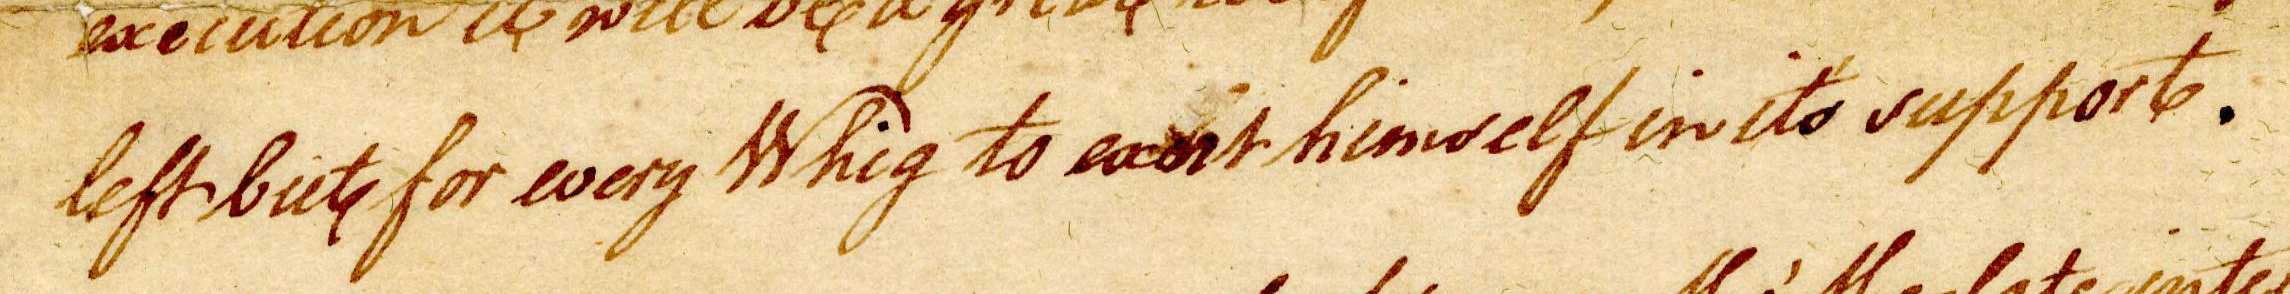left but for every Whig to exert himself in its support.
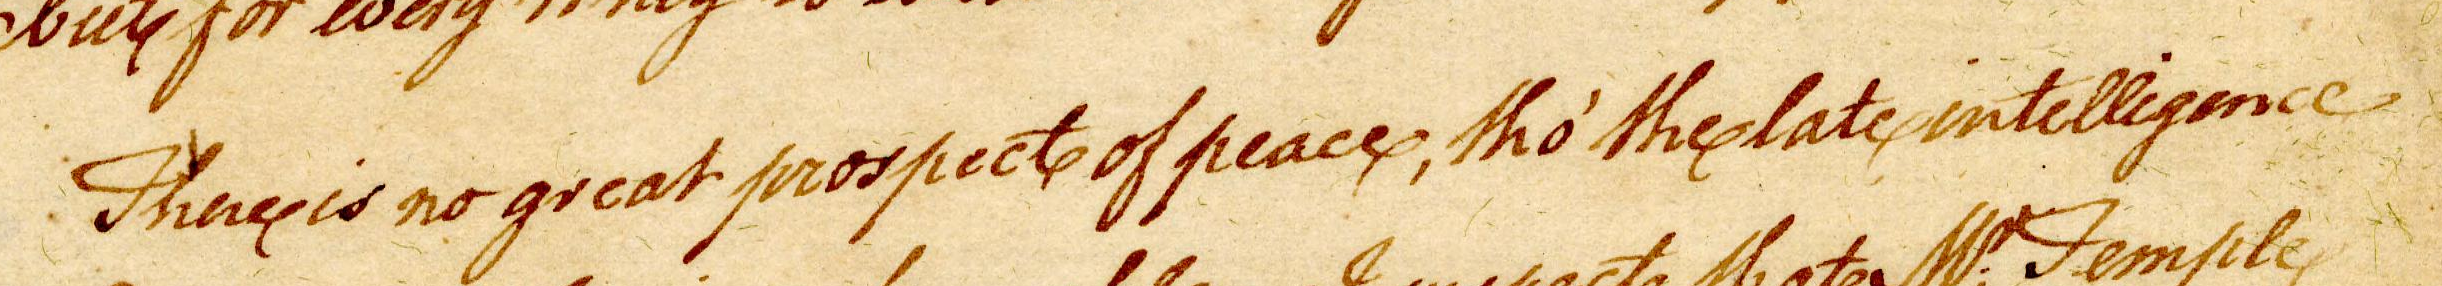There is no great prospect of peace, tho' the late intelligence
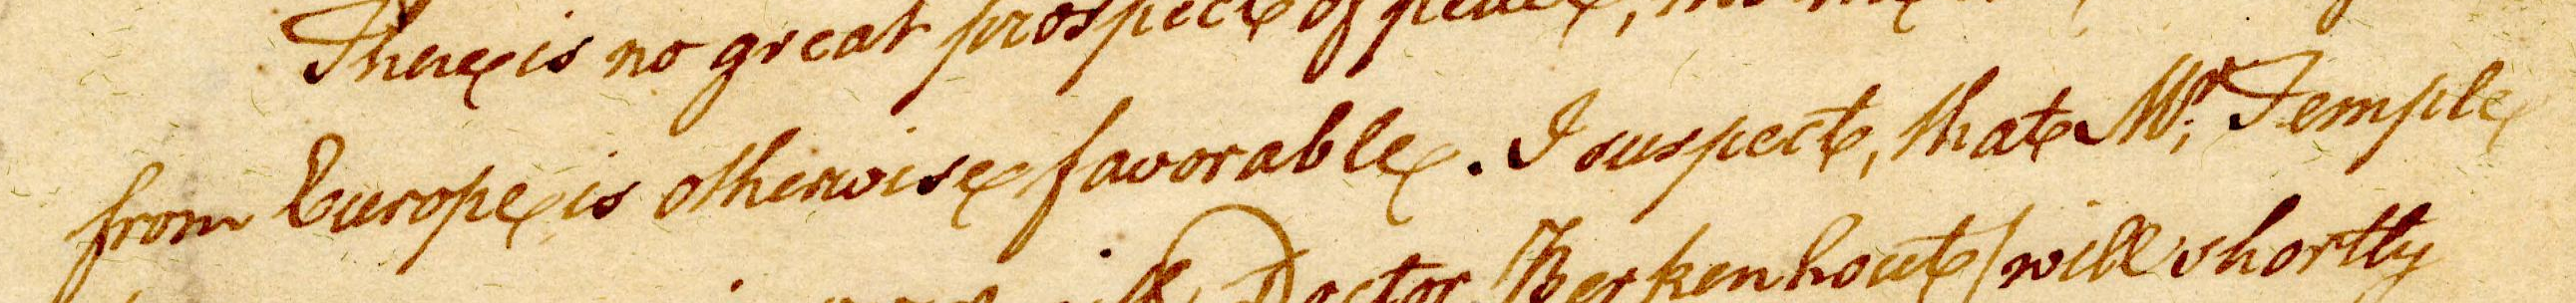from Europe is otherwise favorable. I suspect, that M^r. Temple
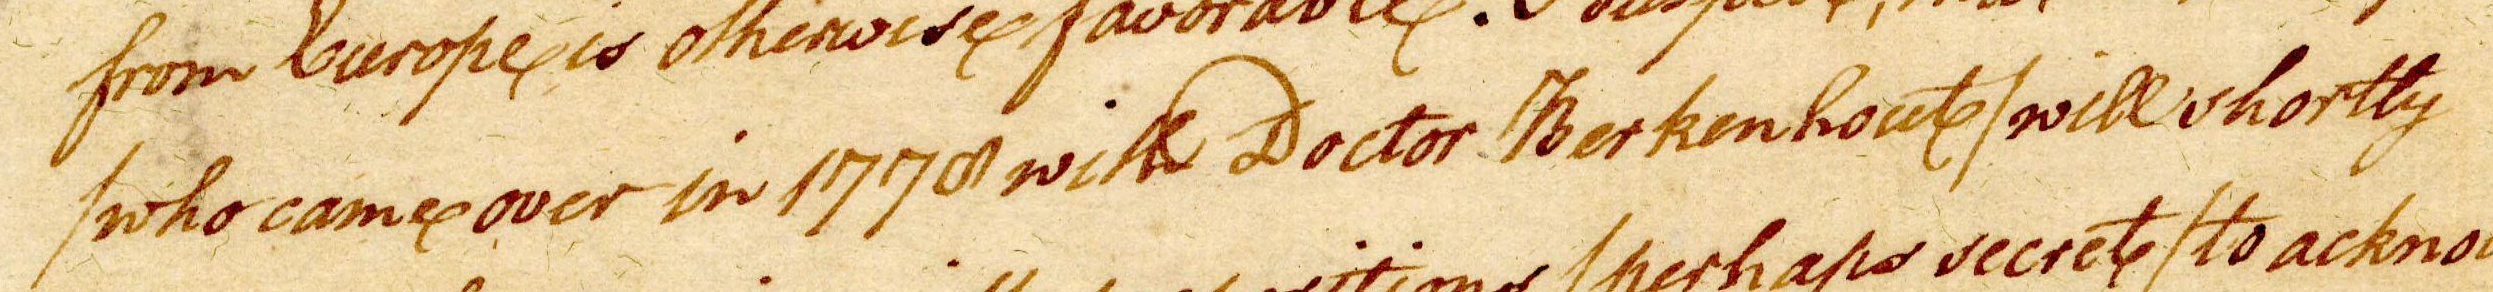/ who came over in 17778 with Doctor Berkenhout / will shortly
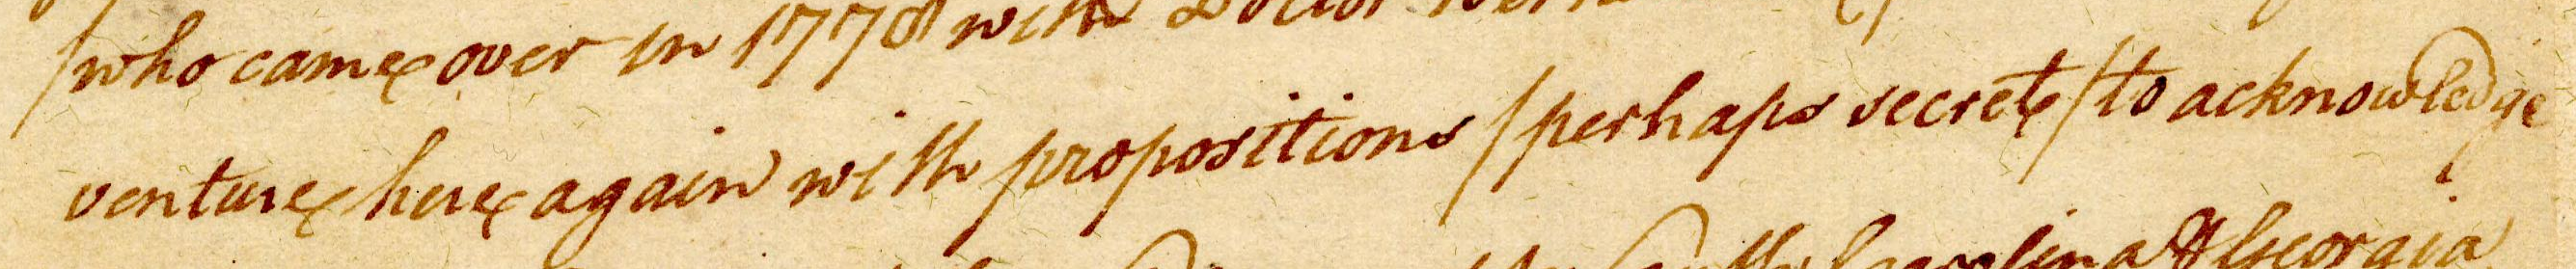venture here again with propositions / perhaps secret / to acknowledge
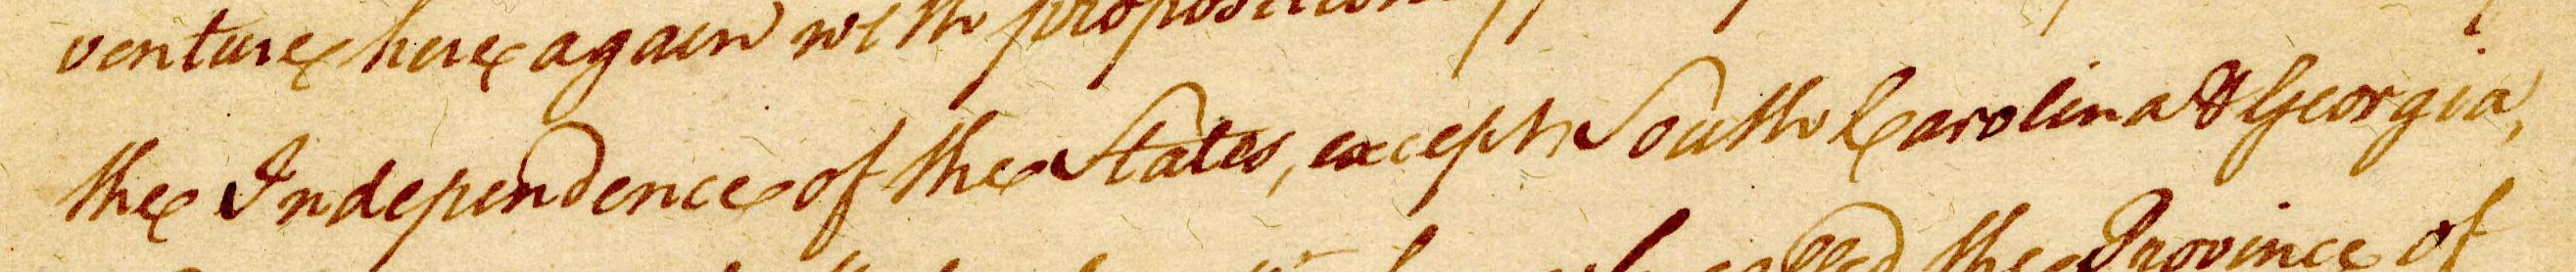the Independence of the States, except South Carolina & Georgia,
